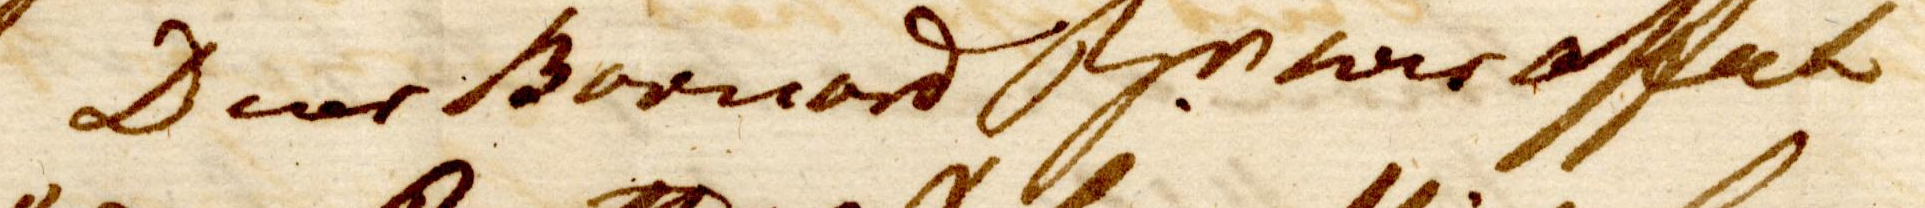Dear Barnard yr. very affect
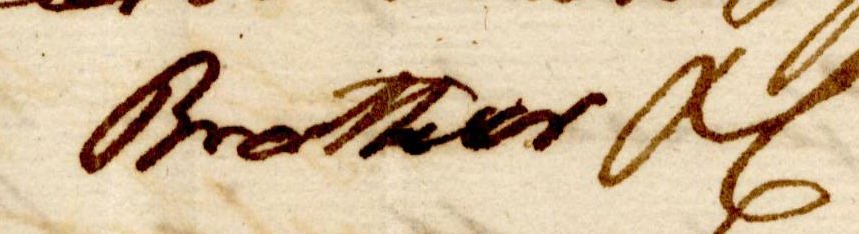Brother &C
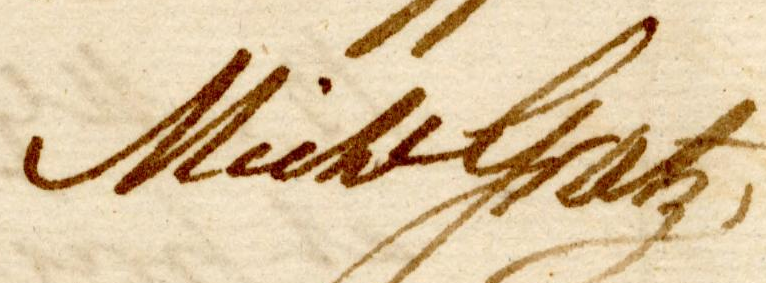Mich^l Gratz
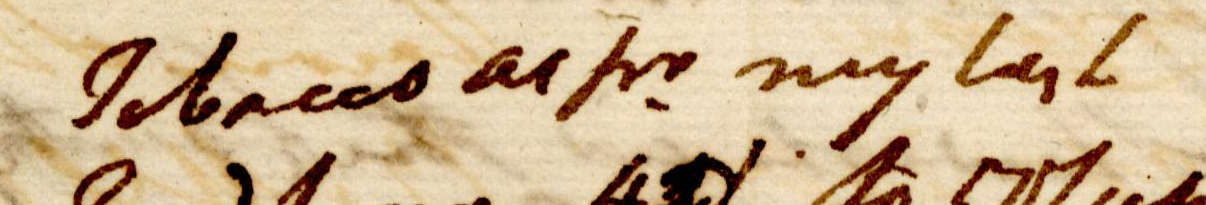Tobacco as per my last
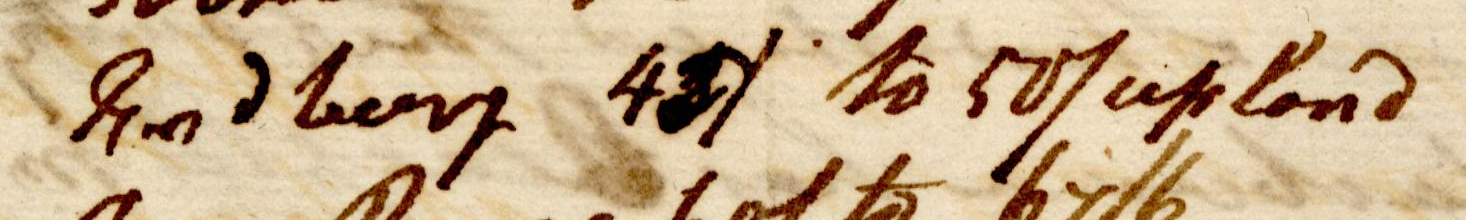and being 43s to 50s as land
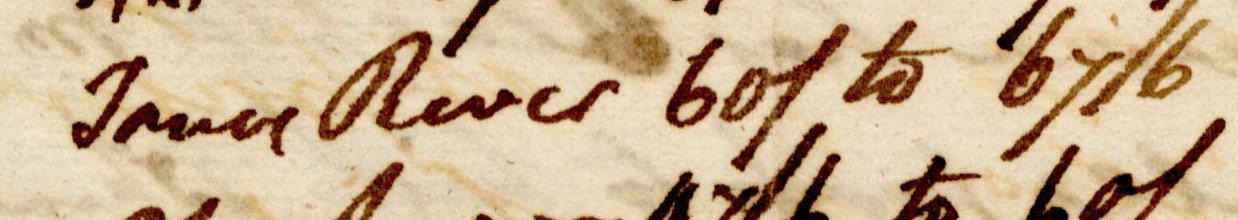James River 60s to 67s6
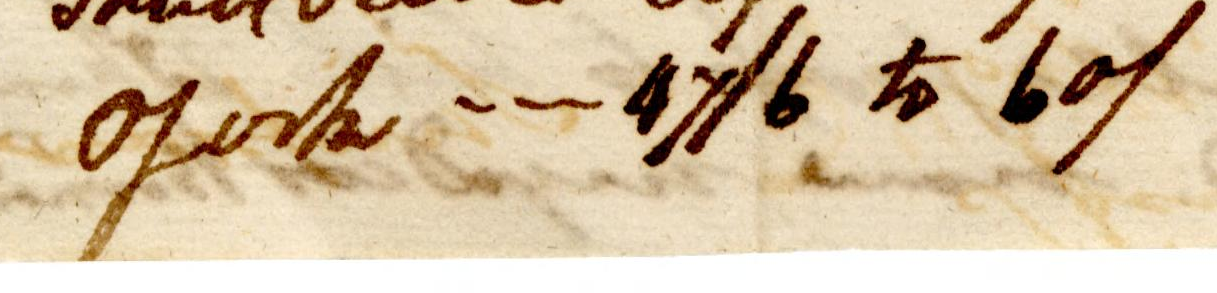York- 47s6 to 60s
